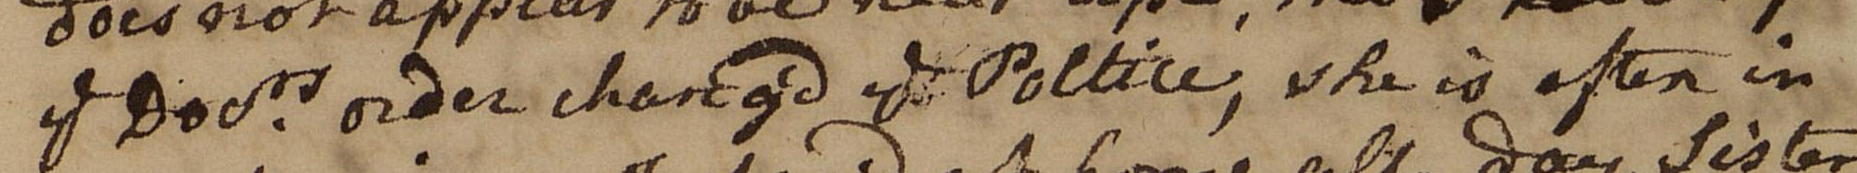y^e Doc^rs. order chang'd y^e Poltice, she is often in
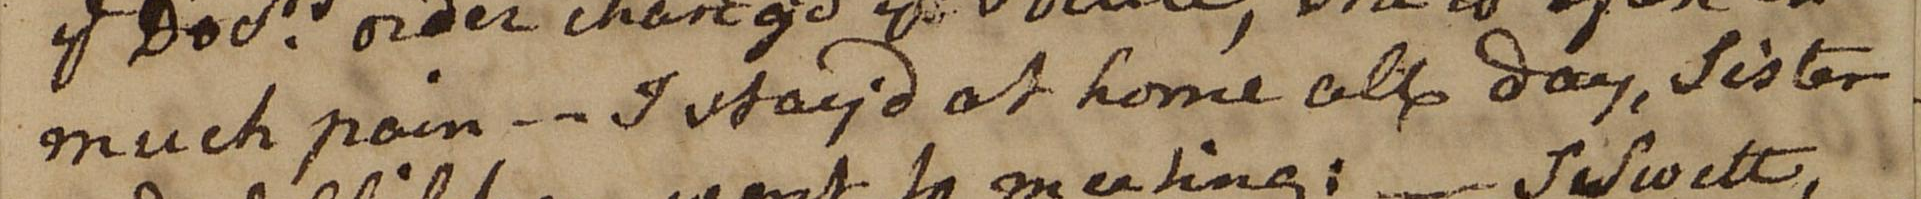much pain-- I stay'd at home all day, Sister
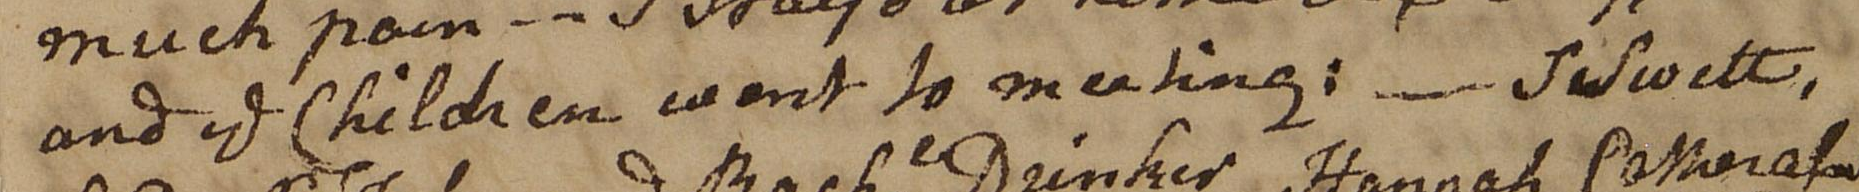and y^e Children went to meeting:- S. Swett,
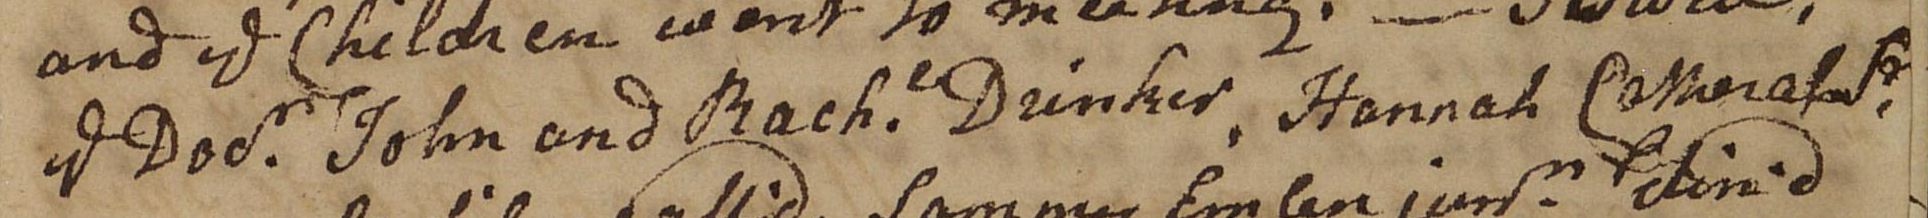y^e Doc^r. John and Rach^l. Drinker, Hannah Catheral S^r.
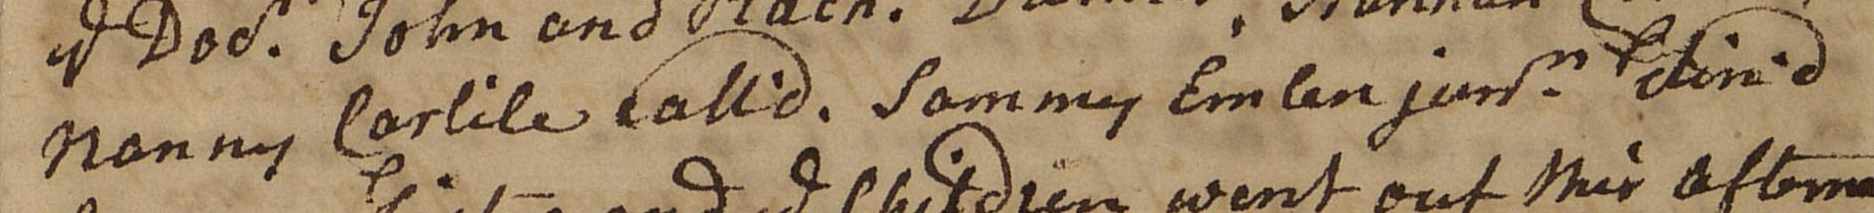Nanny Carlile call'd. Sammy Emlen jun^r. din'd
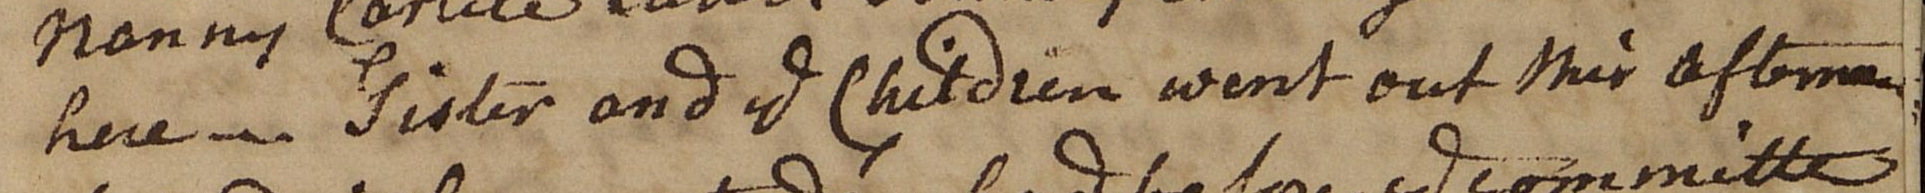here- Sister and y^e Children went out this afternoon
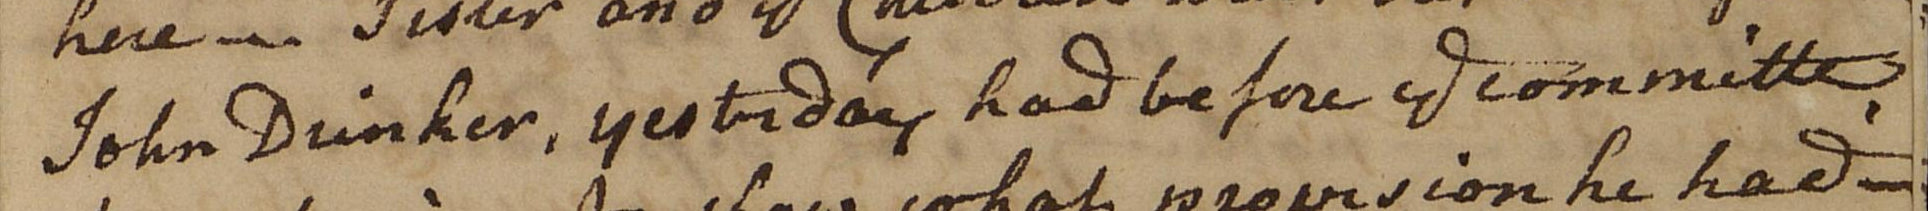John Drinker, yesterday had before y^e committe,
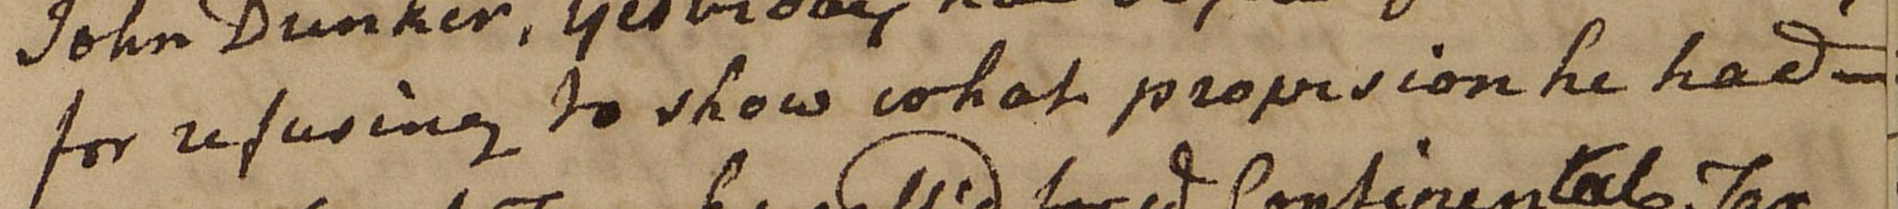for refusing to show what provision he had-
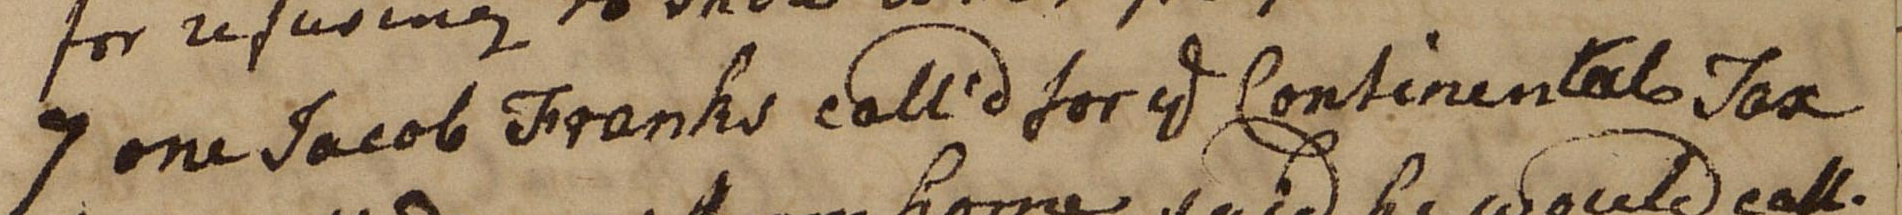7 one Jacob Franks call'd for y^e Continental Tax
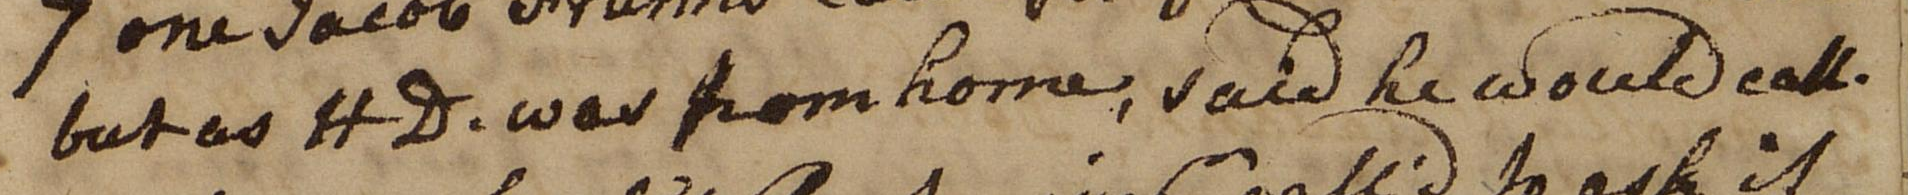but as HD. was from home, said he would call.
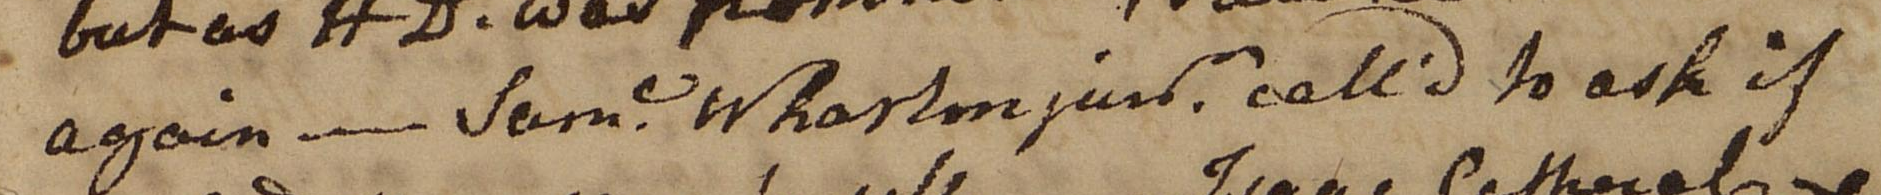again- Sam^l. Wharton jun^r. call'd to ask if
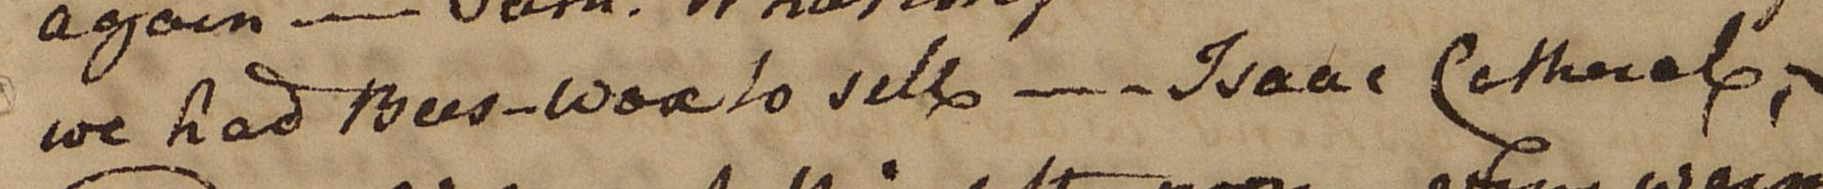we had Bees-Wax to sell- Isaac Catheral, &c
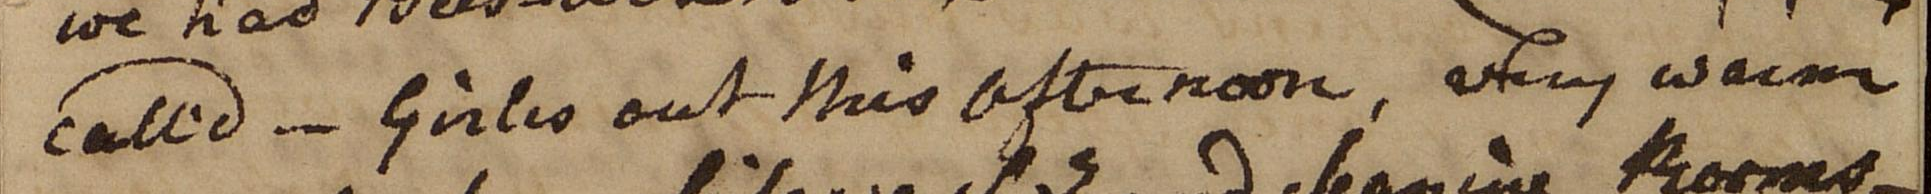call'd- Girles out this afternoon, very warm
